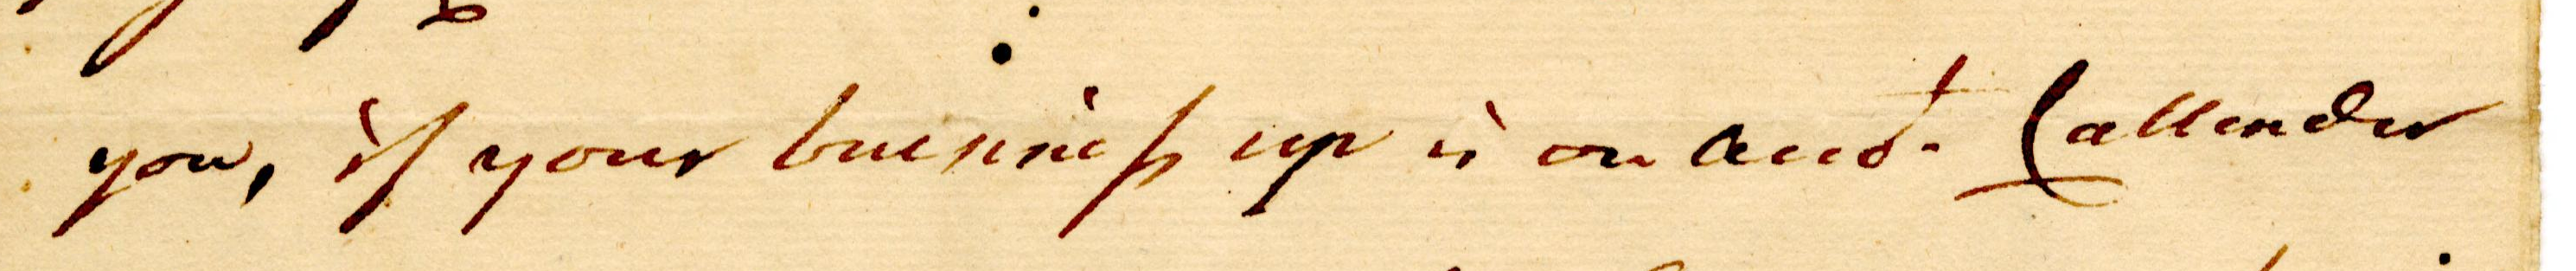you, if your business is on acco^t. Callender
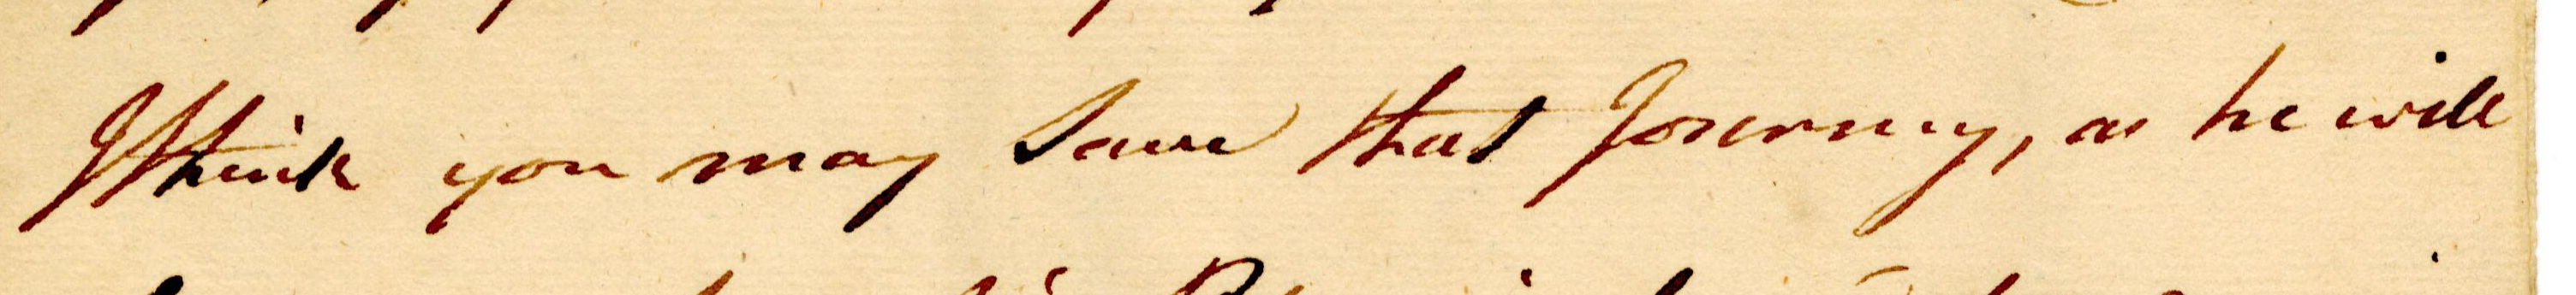I think you may save that Journey, as he will
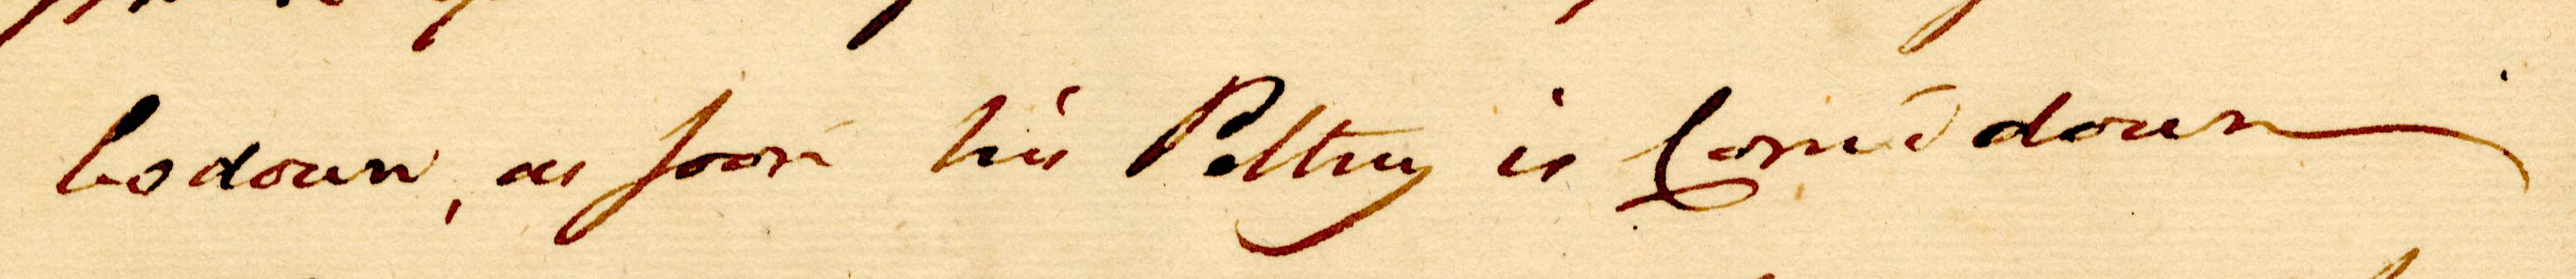Go down, as soon his Peltry is Come down
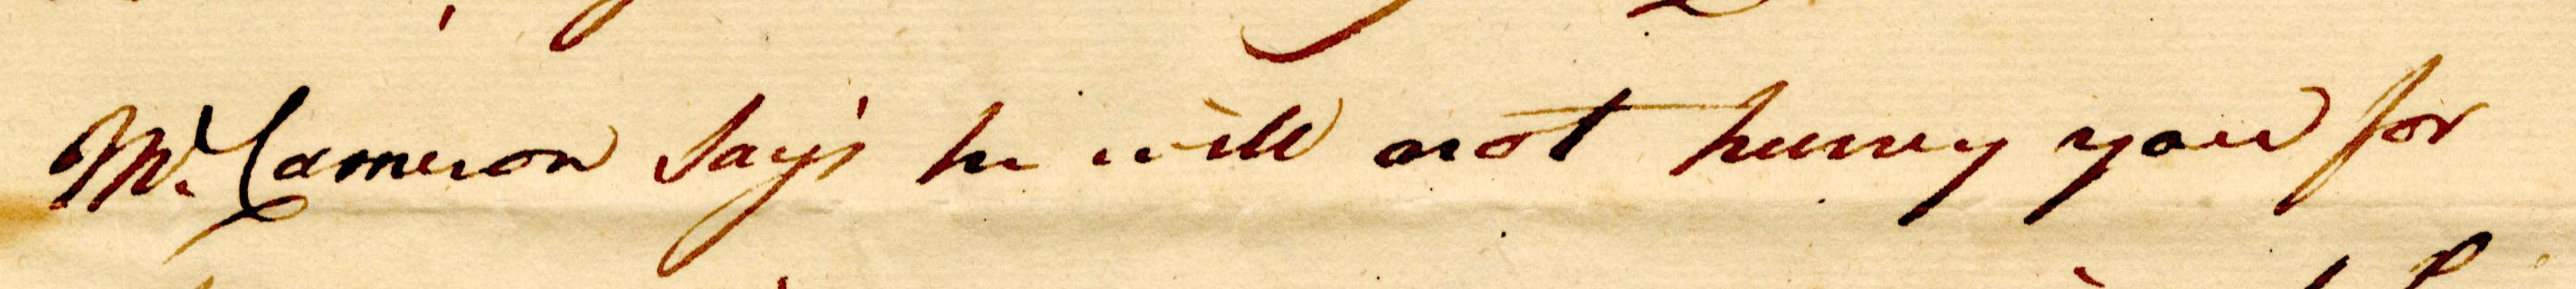M^r. Cameron Says he will not hurry your for
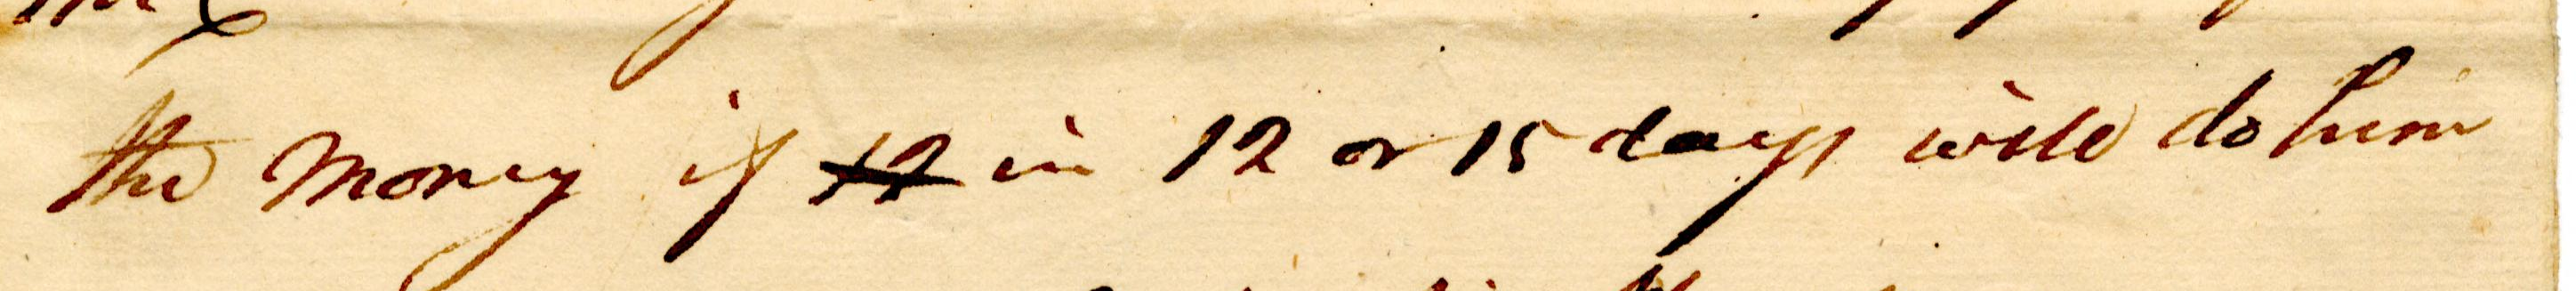the money if [12] in 12 or 15 days will do him
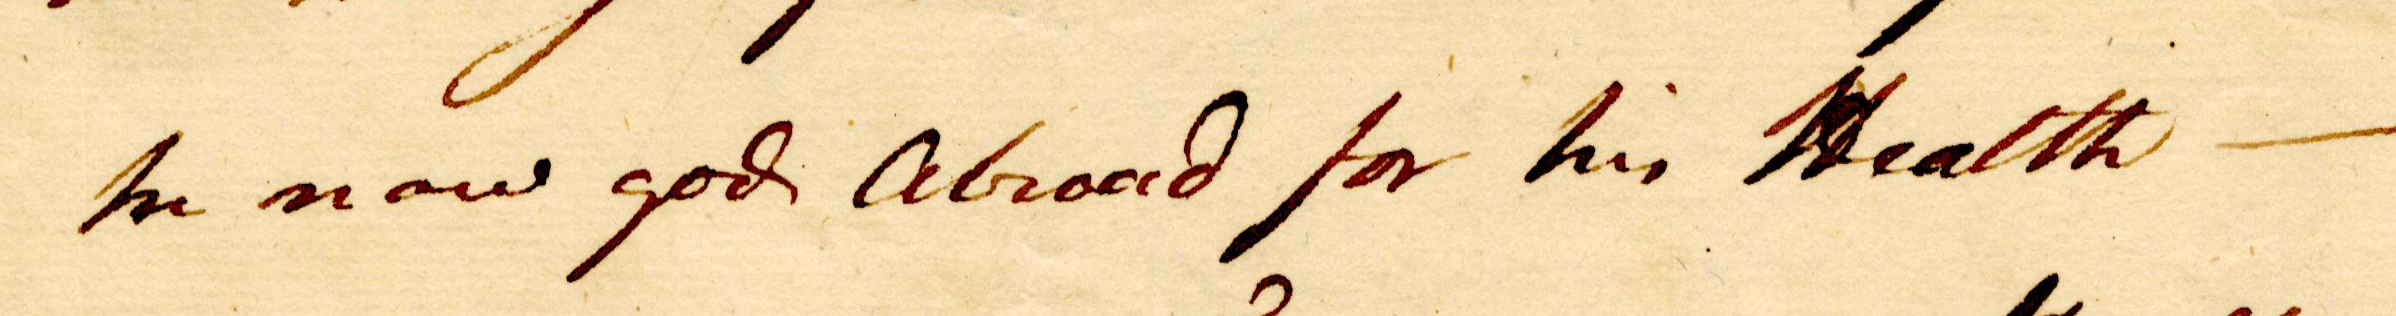he now goes Abroad for his Health
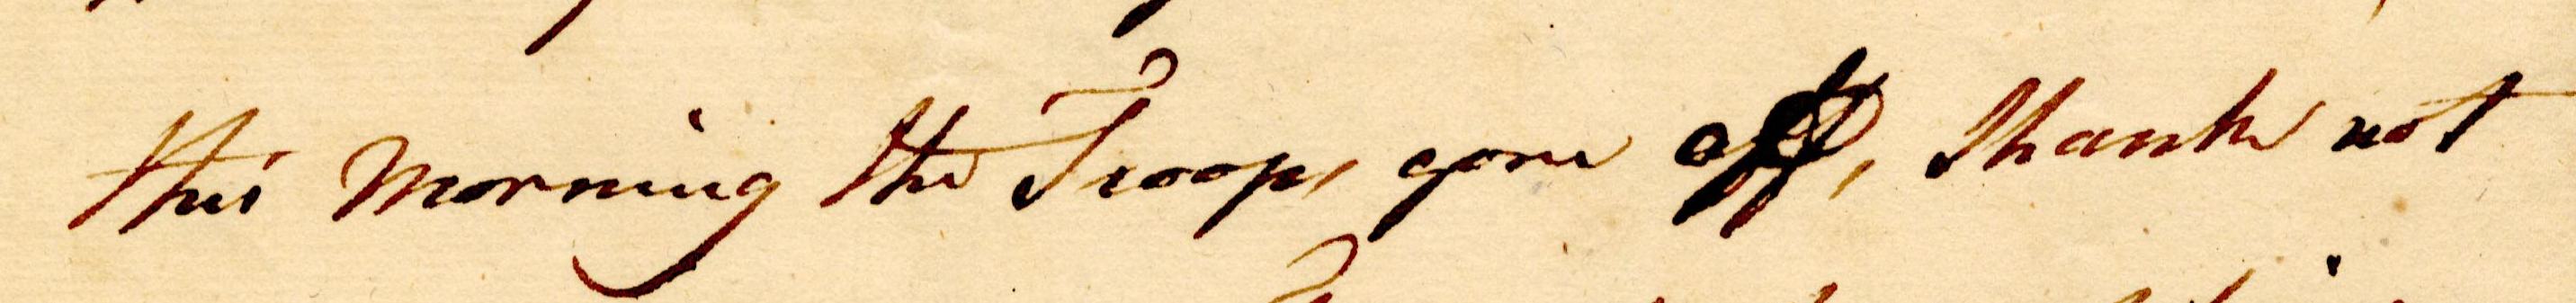this morning the Troops, goe off, shank not
